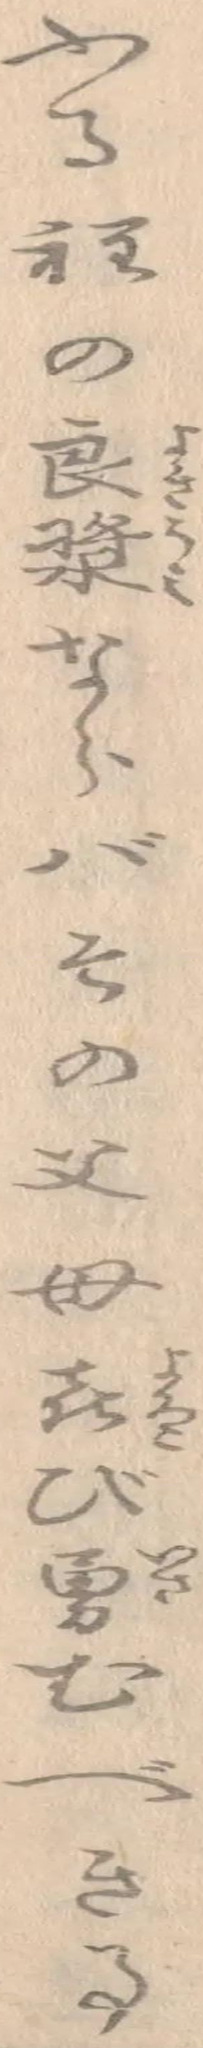ふる程の良漿ならばその父母喜び勇むべき事
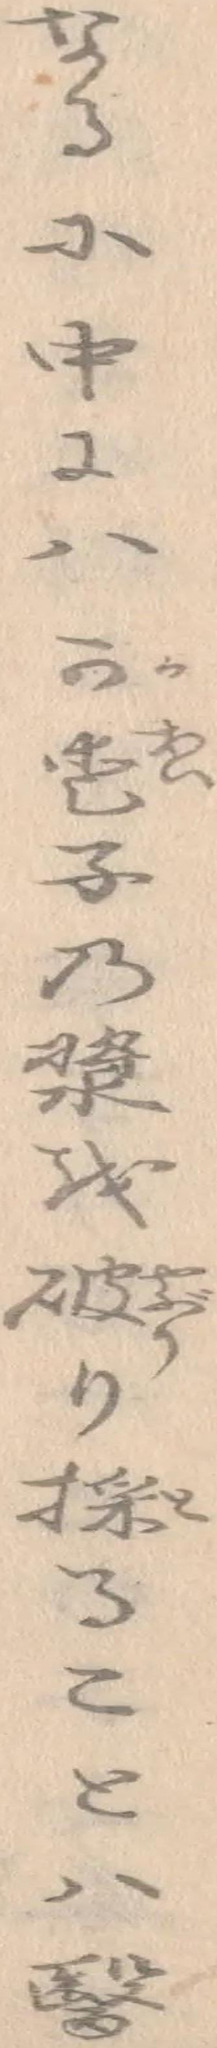なるに中には可愛子の漿を破り採ることは醫
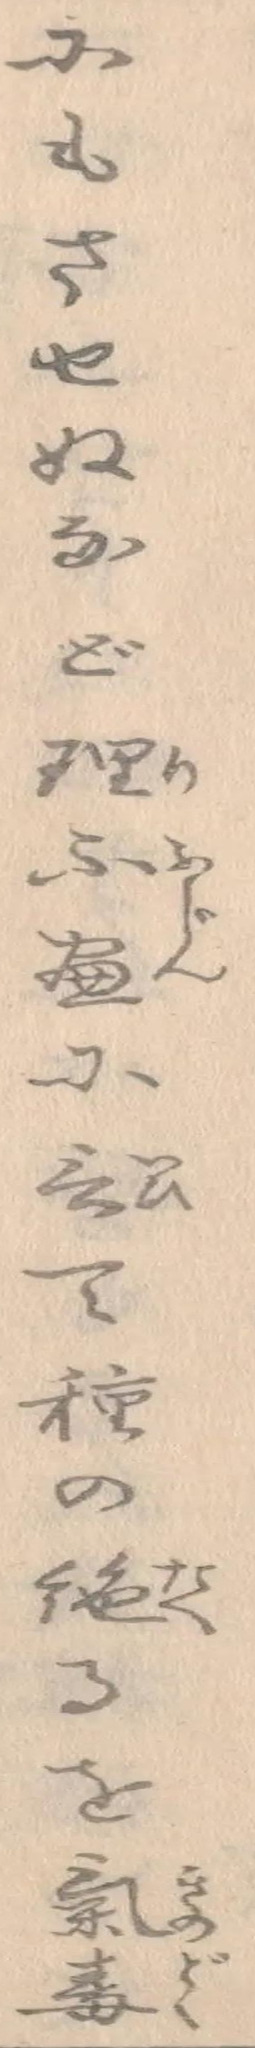にもさせぬなど理不尽に言て種の絶るを気毒
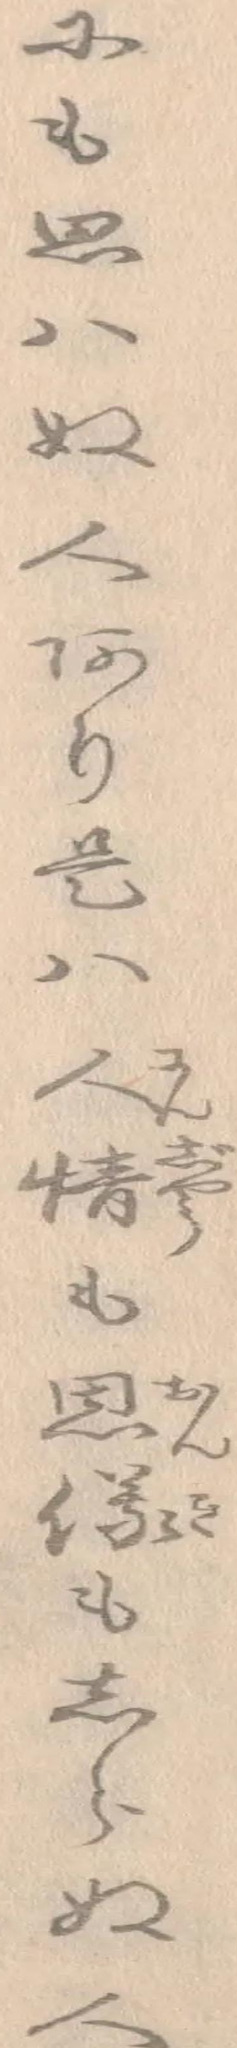にも思はぬ人なり是は人情も恩儀もしらぬ人
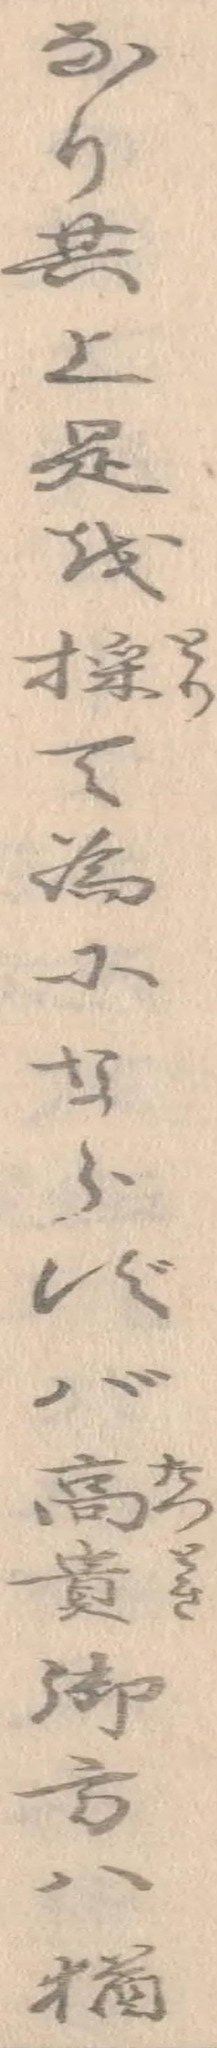なり其上是を採て為にならずば高貴御方は猶
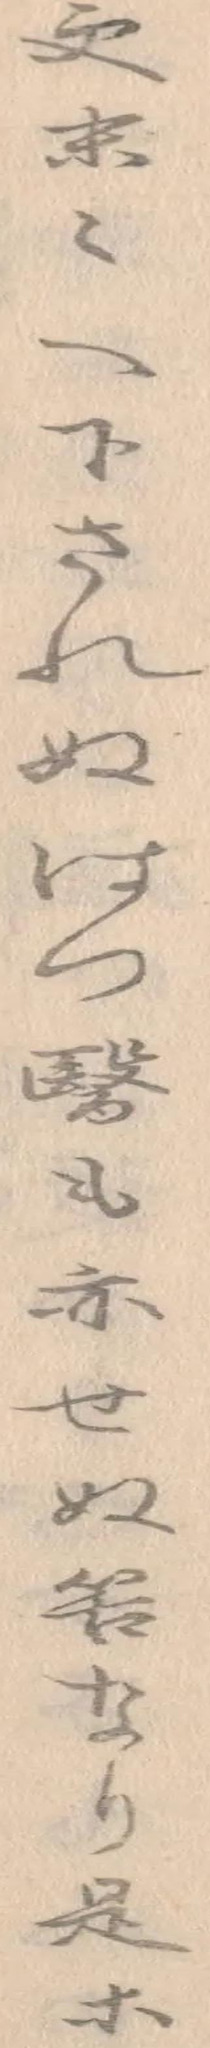更末々へ下されぬはつ醫も亦せぬ筈なり是等
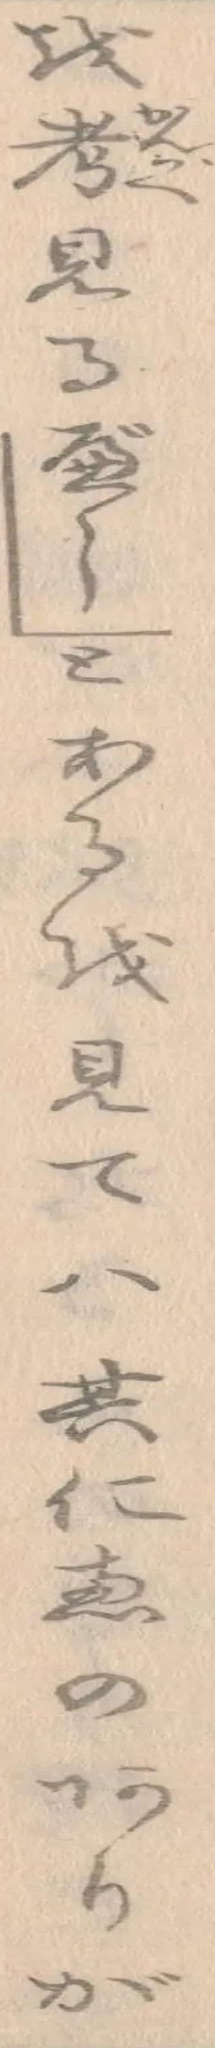を考見るべし」とあるを見ては其仁恵のありが
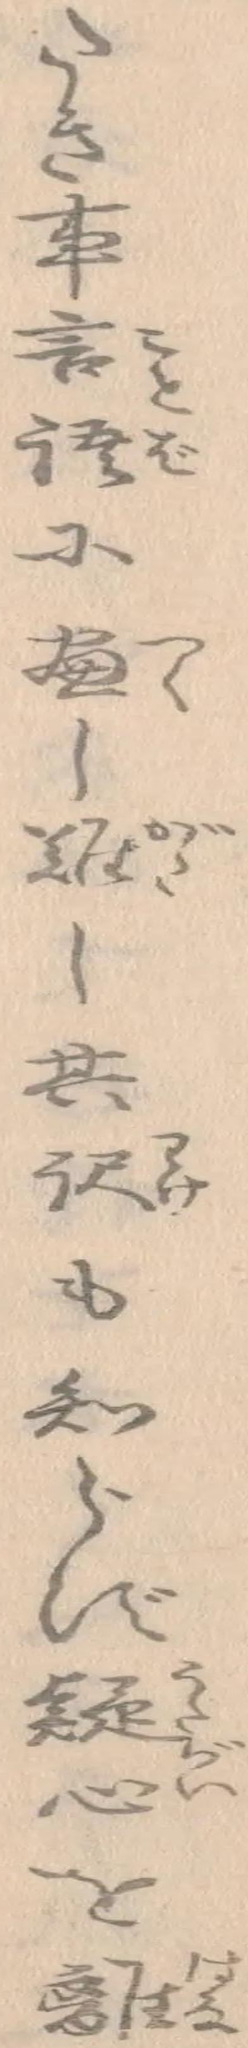たき事言語に尽し難し其訳も知らず疑心を離
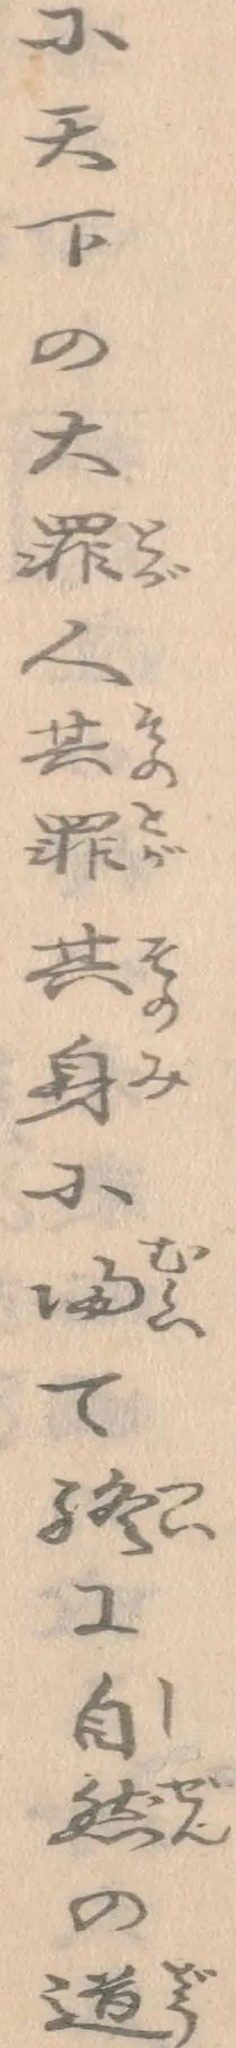に天下の大罪人其罪其身に帰て終に自然の道
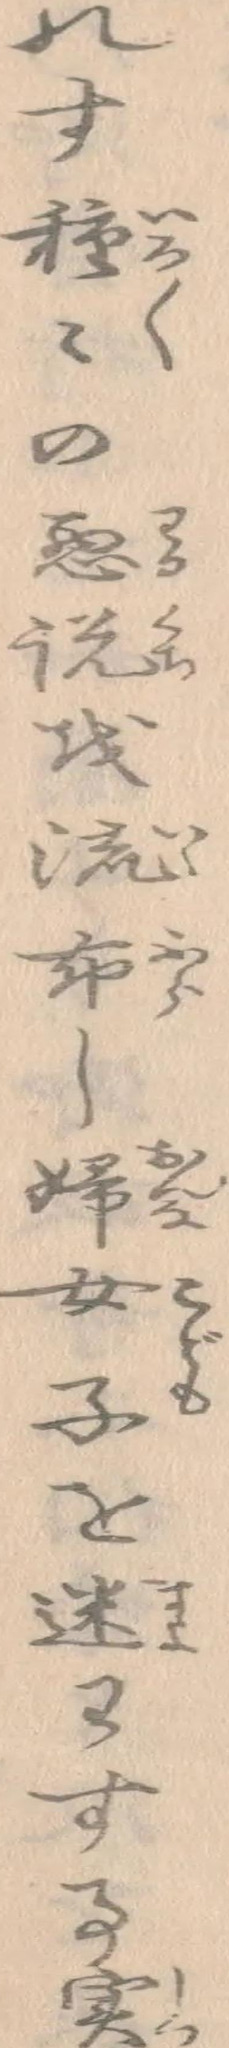れす種々の悪説を流布し婦女子を迷わす事実
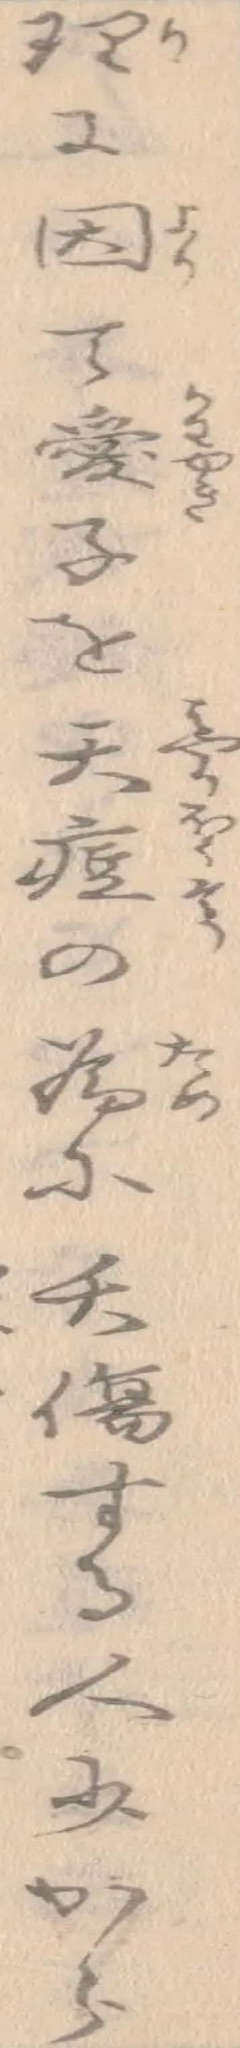理に因て愛子を天痘の為に夭傷する人少から
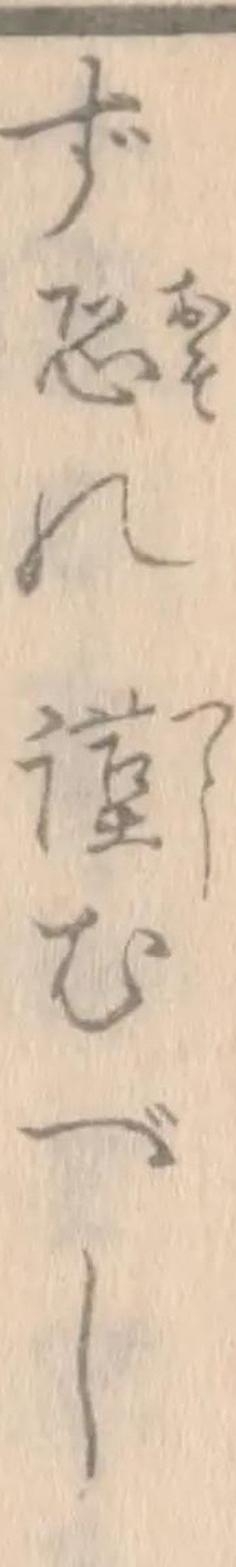ず恐れ謹むべし
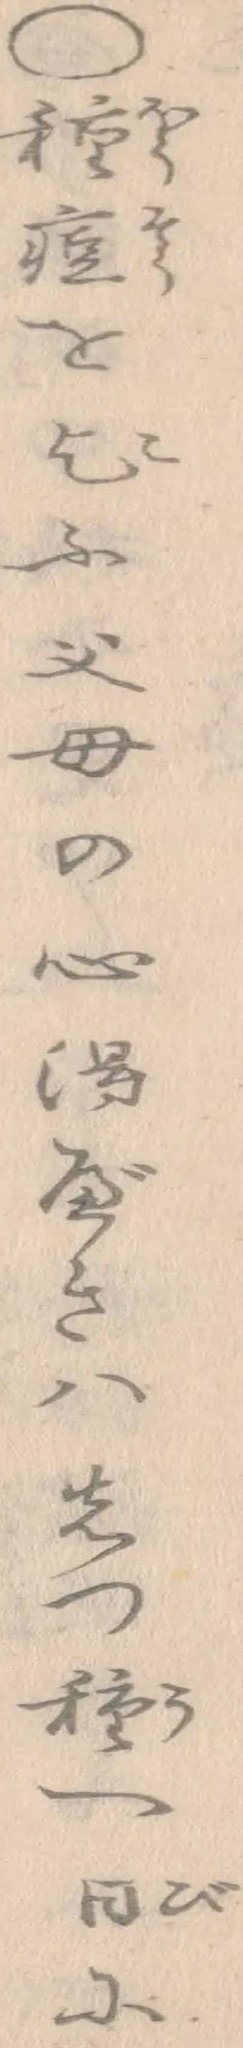○種痘を乞ふ父母の心得べきは先つ種へ日に
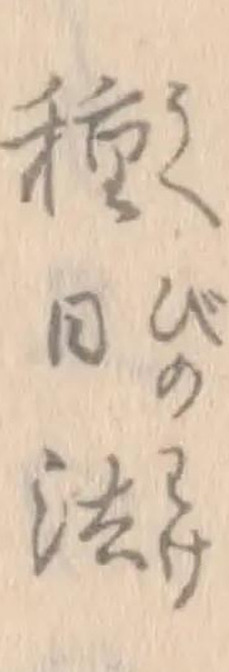種日法
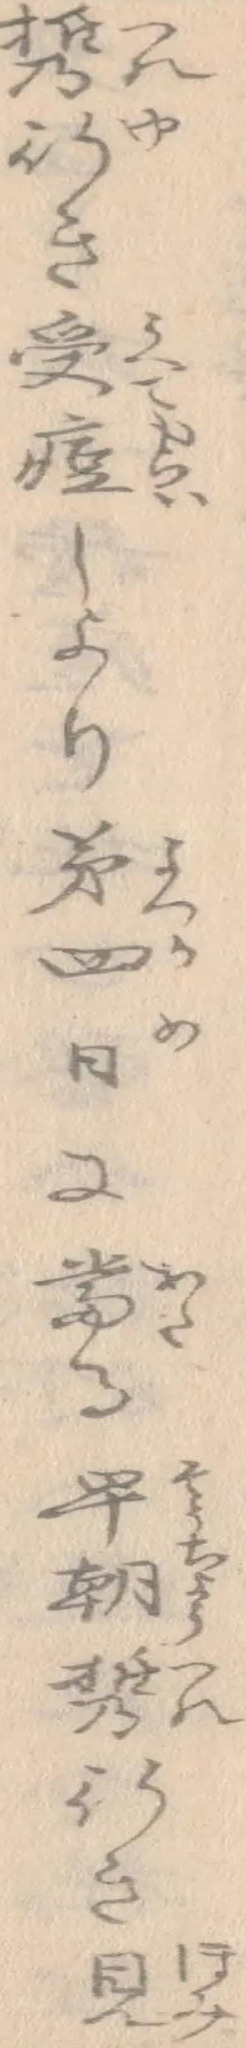携行き受痘しより第四日に当る早朝携行き見
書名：散花養生訓
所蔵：国立国会図書館 National Diet Library, JAPAN
